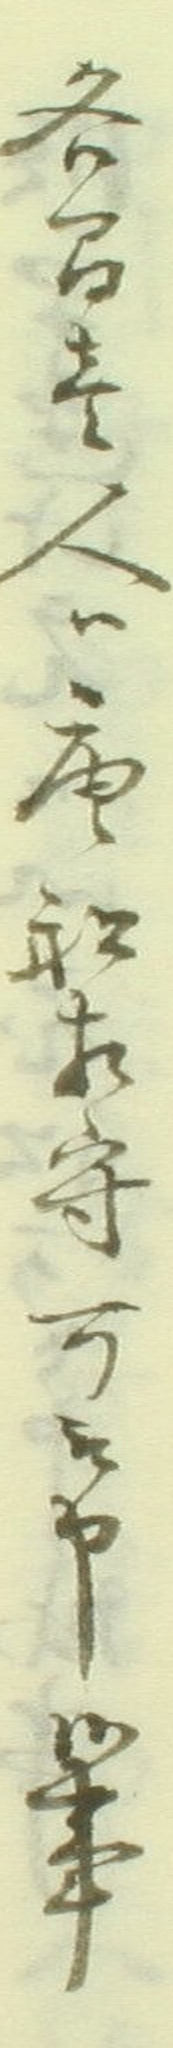各間壱人は唐船相守可被申候事
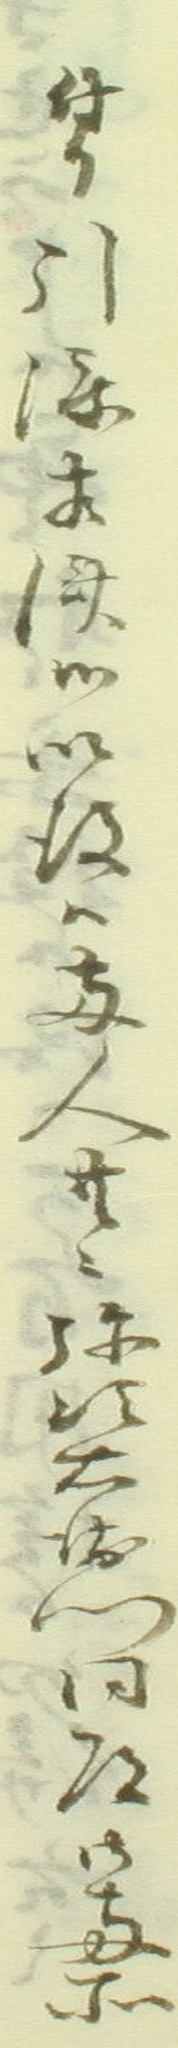付り引渡相済候候得は両人共に弥次右衛門同道御両所
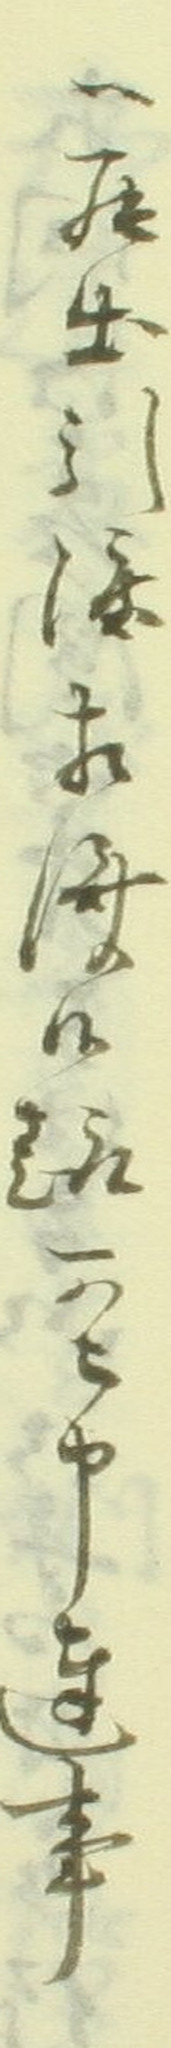へ罷出引渡相済候趣可被申達事
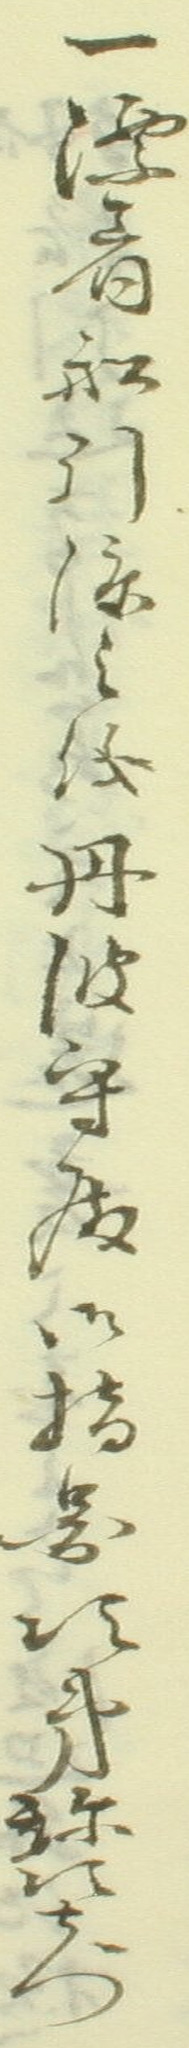一漂着船引渡之儀丹波守殿御指図次第弥次右衛門
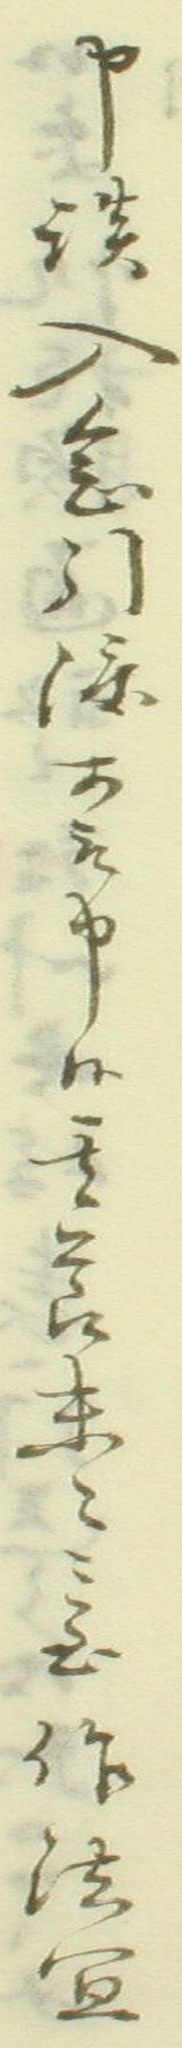申談入念引渡可被申候其節末々に至作法宜
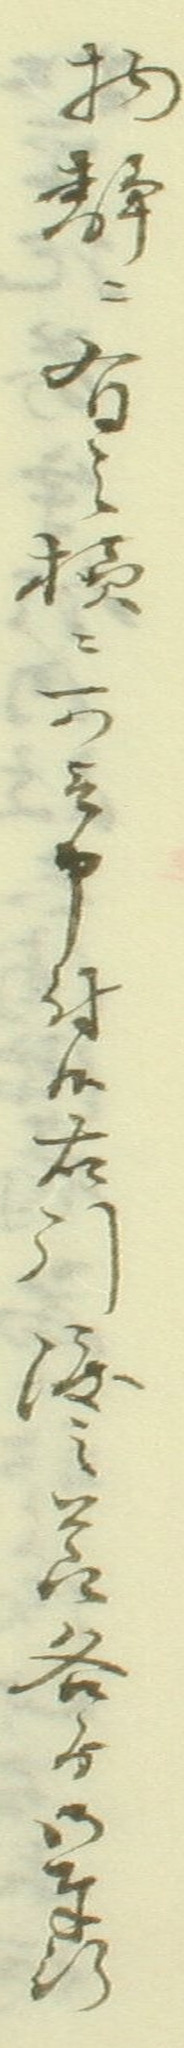物静に有之様に可被申付候右引渡之節各ゟ御奉行
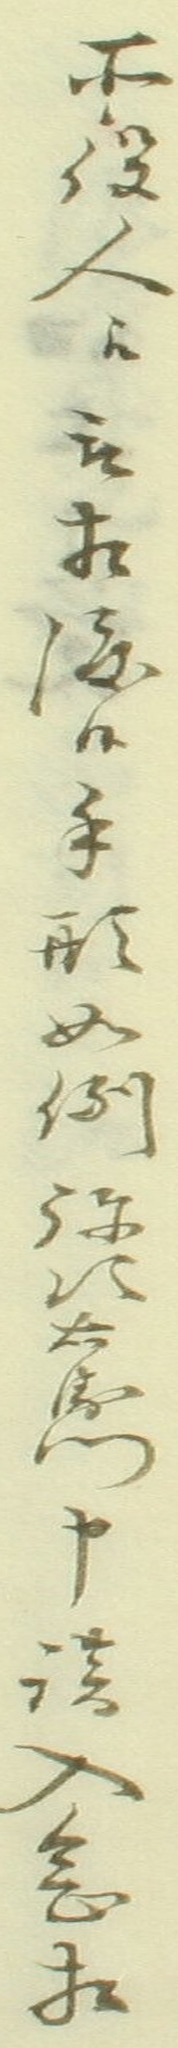所役人え被相渡候手形如例弥次右衛門申談入念相
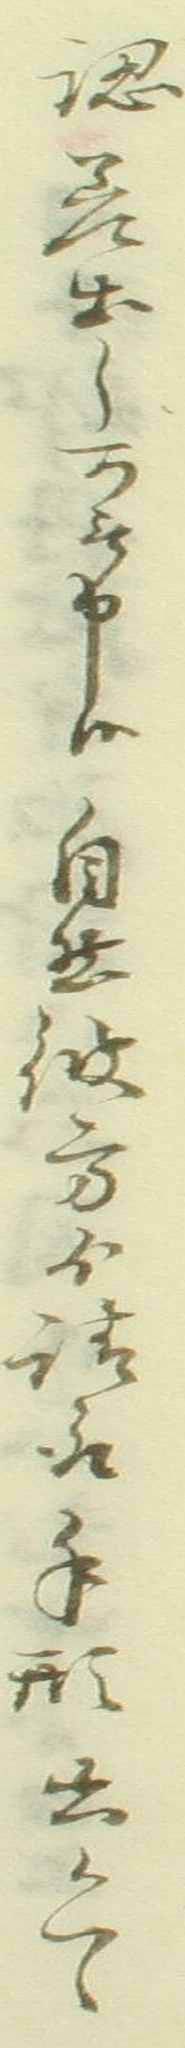認差出し可被申候自然彼方ゟ請取手形出候はゝ
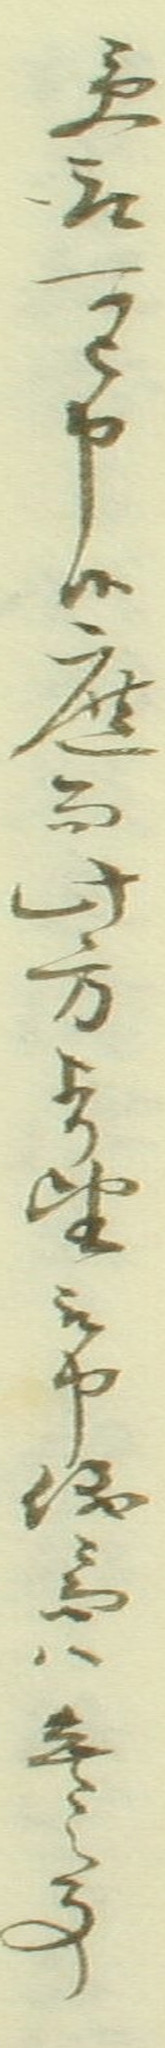受取可被申候遮而此方より望被申儀に而は無之事
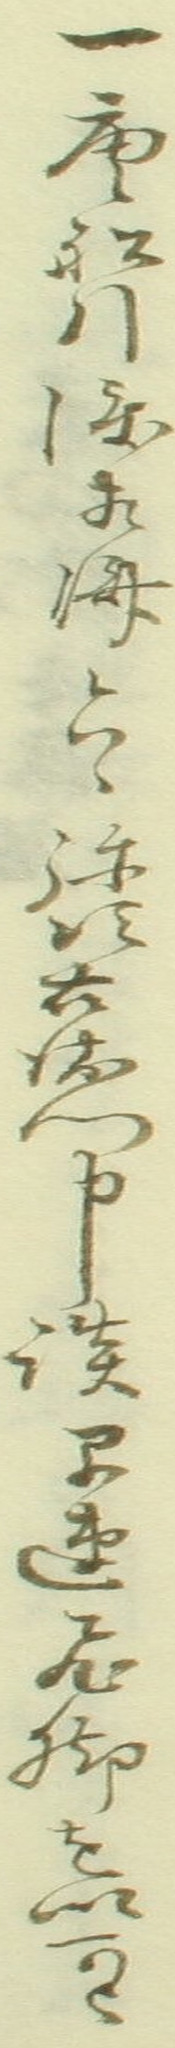一唐船引渡相済候はゝ弥次右衛門申談早速飛脚を以可被
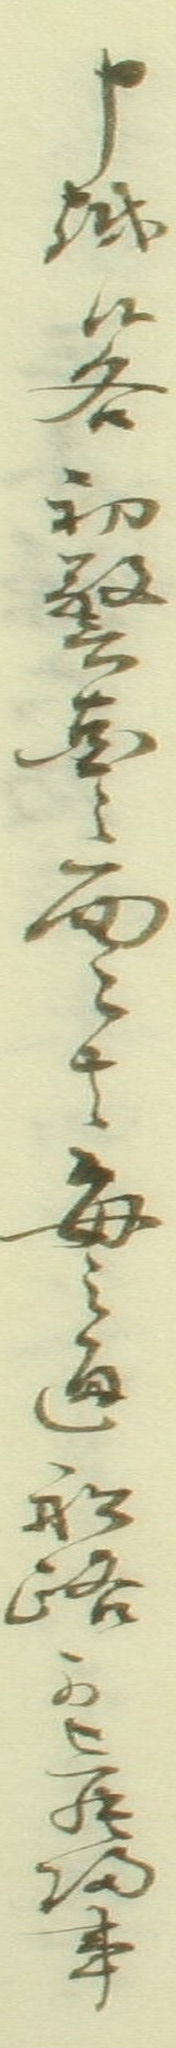申越候各初警固之面々は毎之通船路可被罷帰事

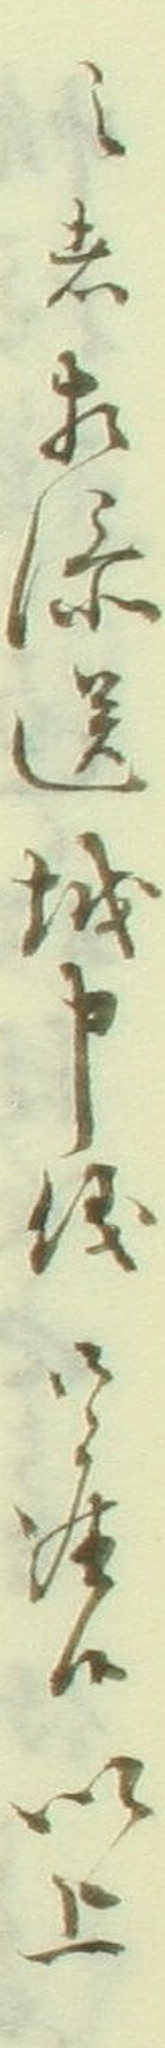之者相添送越申儀御座候以上
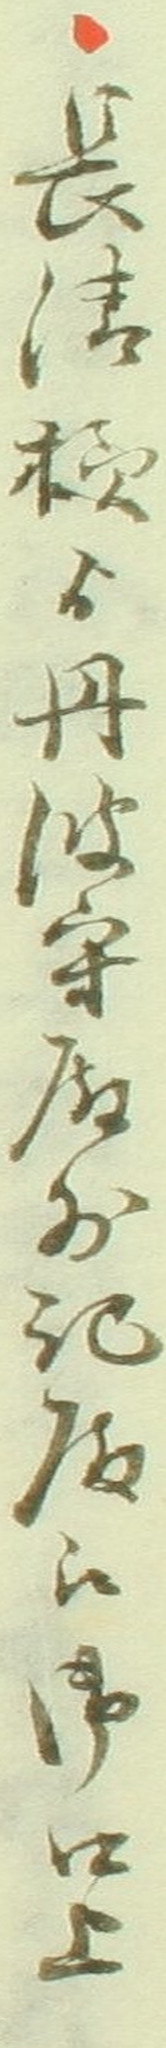長清様ゟ丹波守殿少記殿え御口上
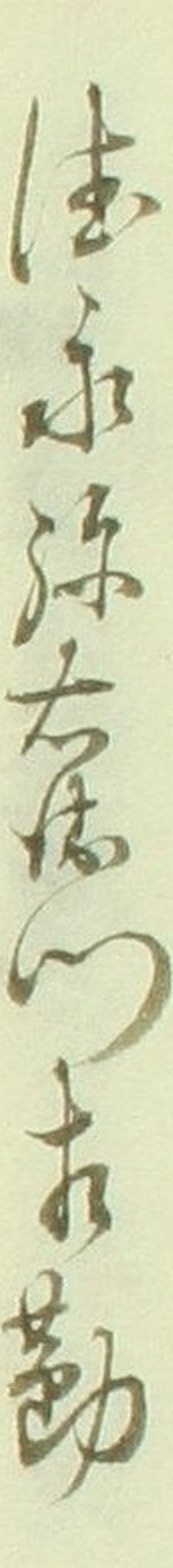徳永弥右衛門相勤
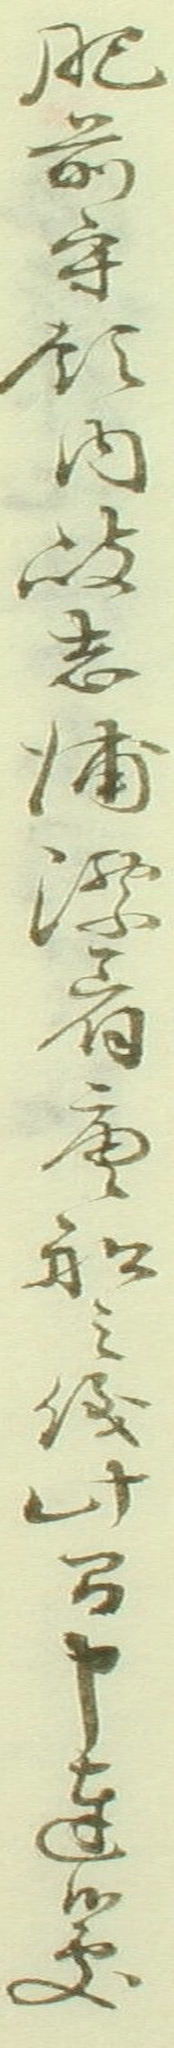肥前守領内岐志浦漂着唐船之儀此間申達候処
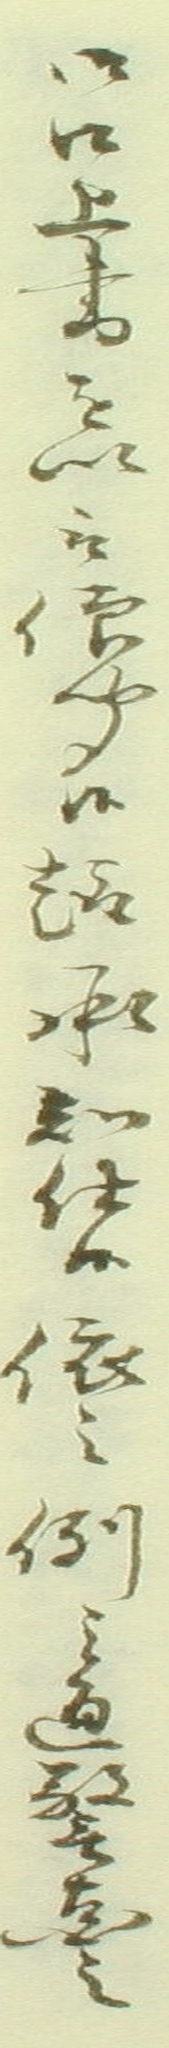御口上書を以被仰聞候趣承知仕候依之例之通警固之
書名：異国船漂着記
